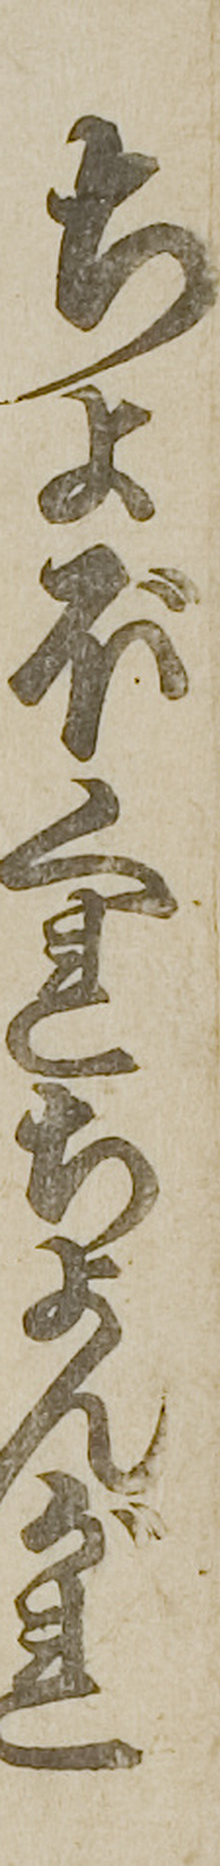ちょぼくれちょんがれ
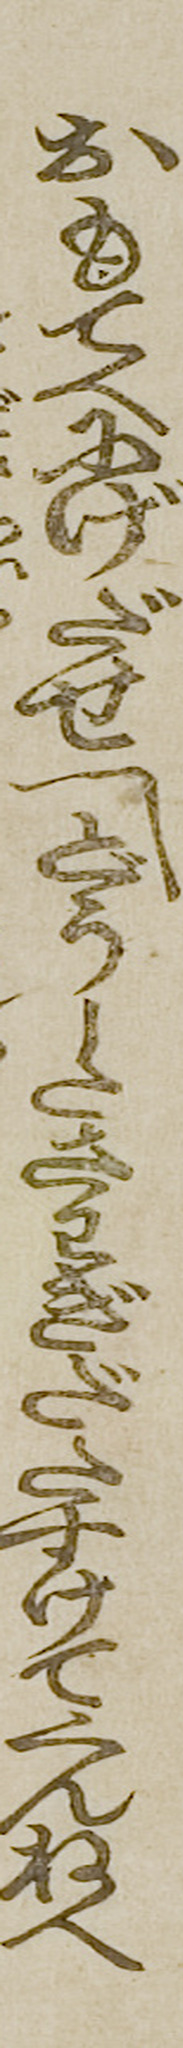おもてへにげだせ「どうしたさわぎだたすけてくんねへ
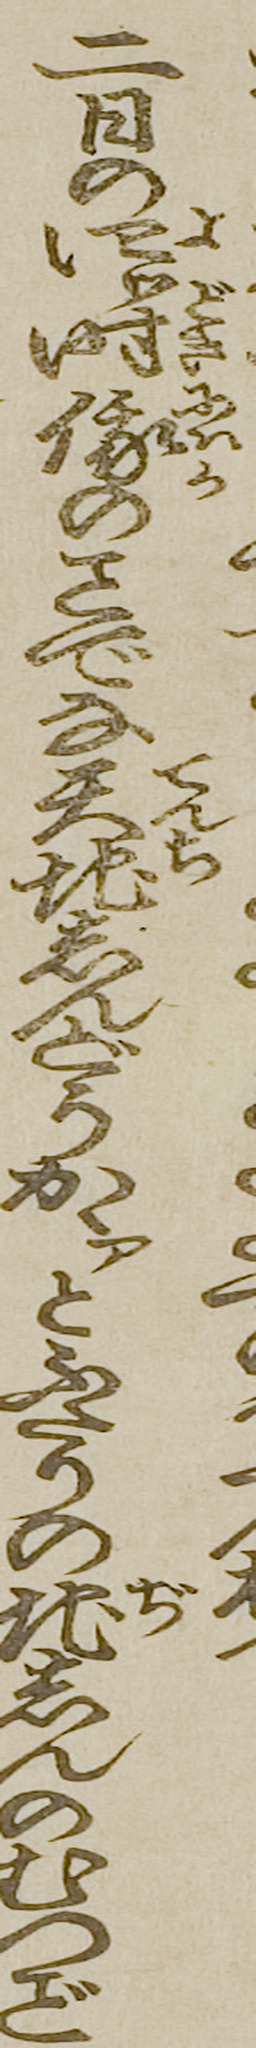二日の四つ時俄のことでな天地しんどうかゝあとふたりの地しんのむつごと
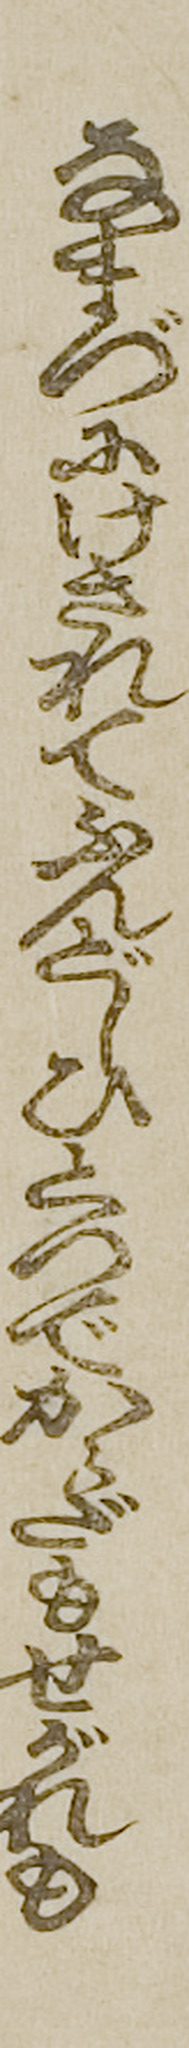なまづにけされてふんどしひとつでからだもせがれも
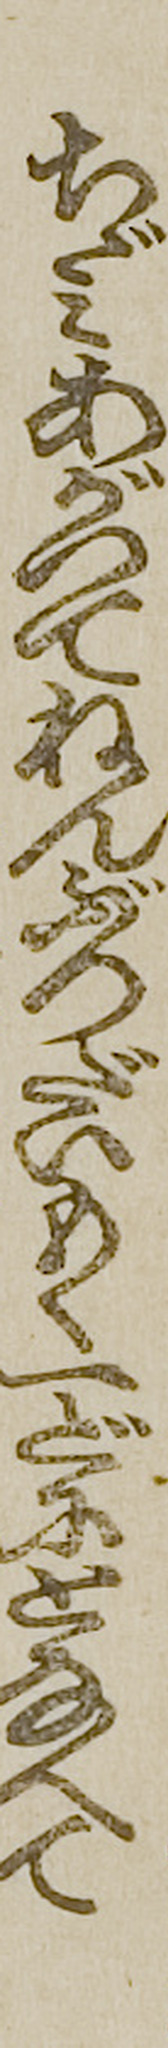ちゞみあがつてんねんぶつだいもく一どにとなへて
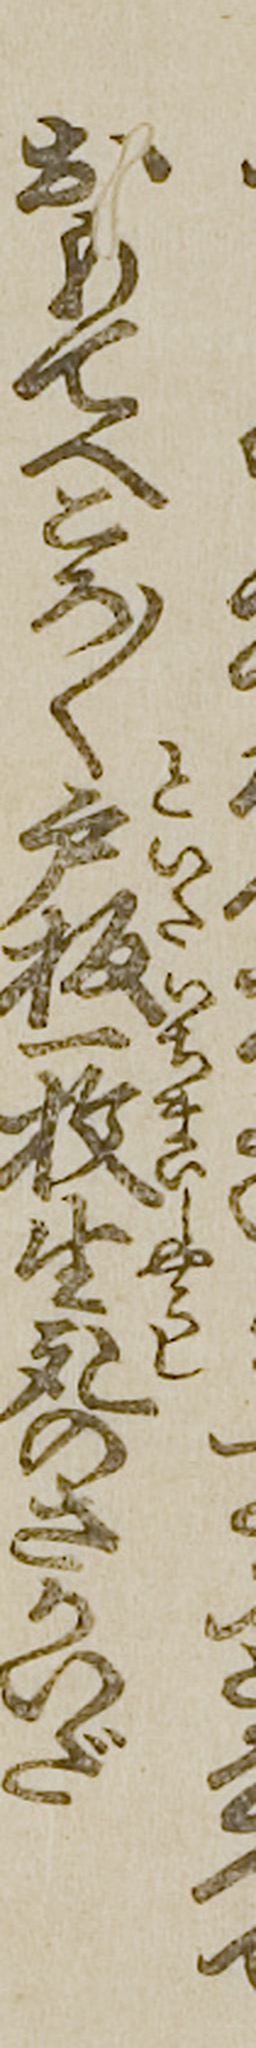おもてへころ〳〵戸板一枚生死のさかいだ
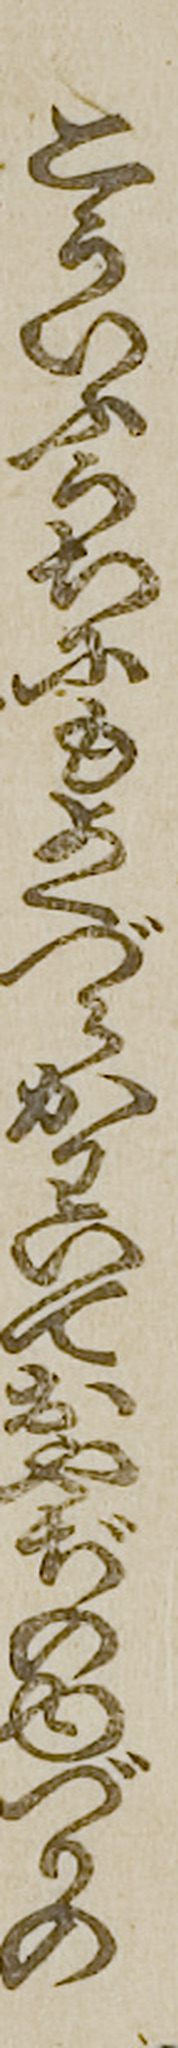こういふうちにもよくづらかわいておやじのゆづりの
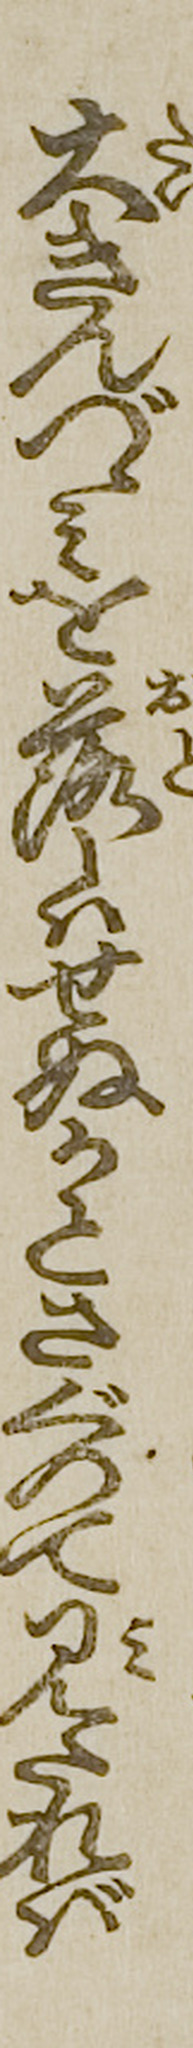大きんづゝみを落しはせぬかとさぐつて見たれば
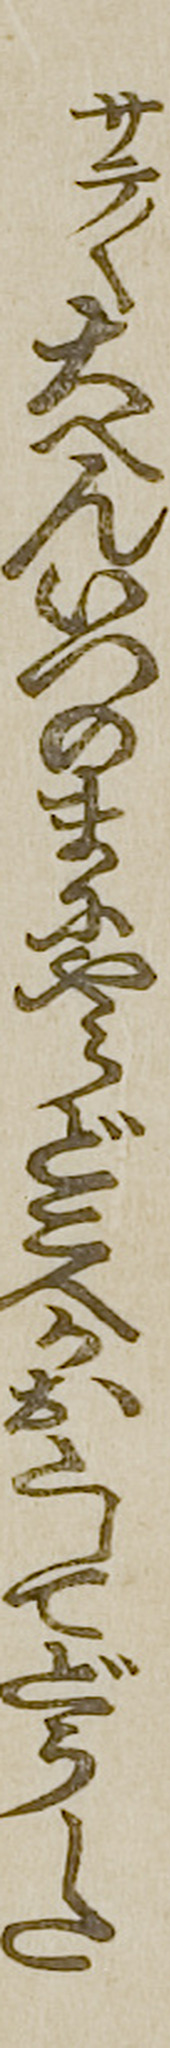さて〳〵大へんいつのまにやらどこへかおとしてどうした
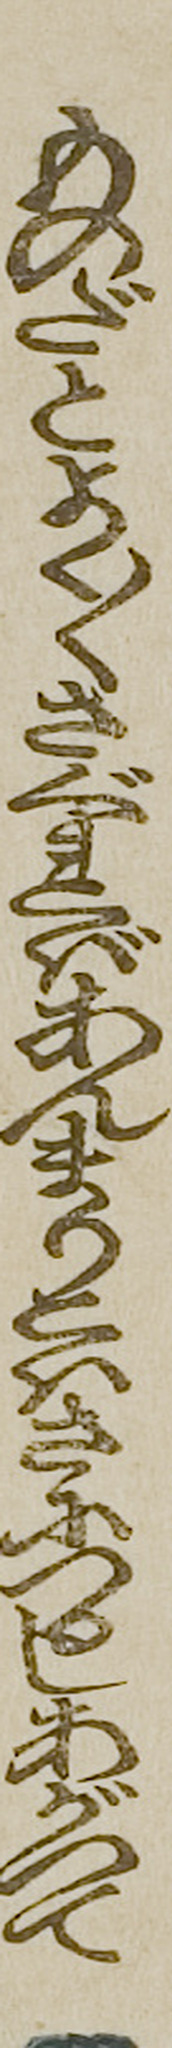ものだとよく〳〵さぐればあんまりこはさにつるしあがつて
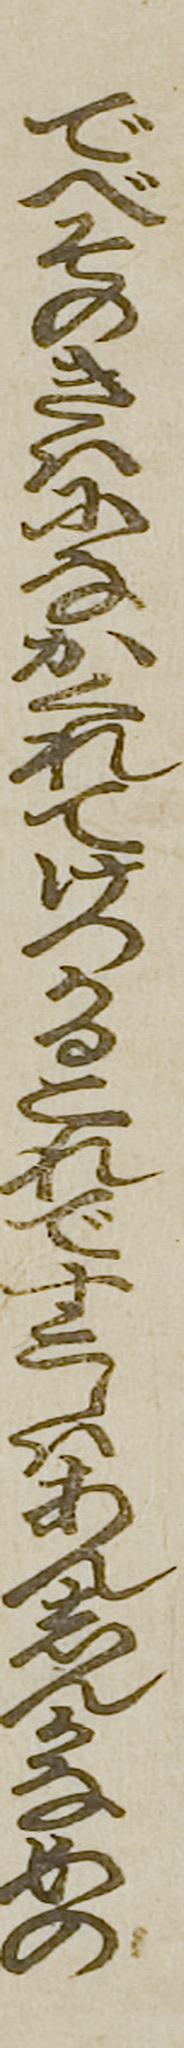でべそのきはになかくれてけつかるこれですこしはあんしんかなめの
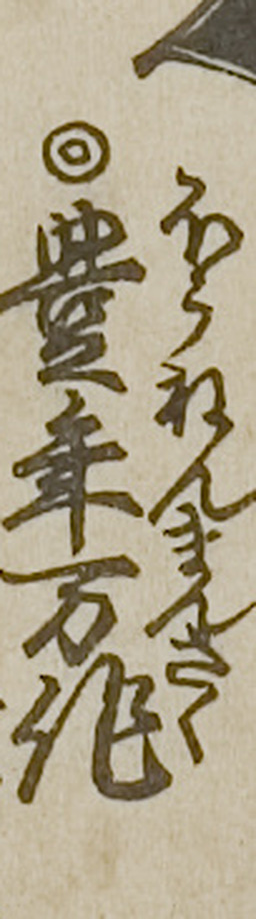◎豊年万作
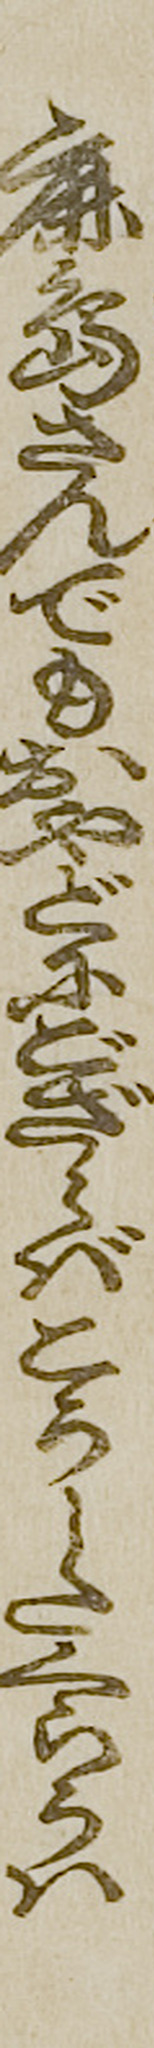鹿島さんでもおやどにござらばこうしたくらうは
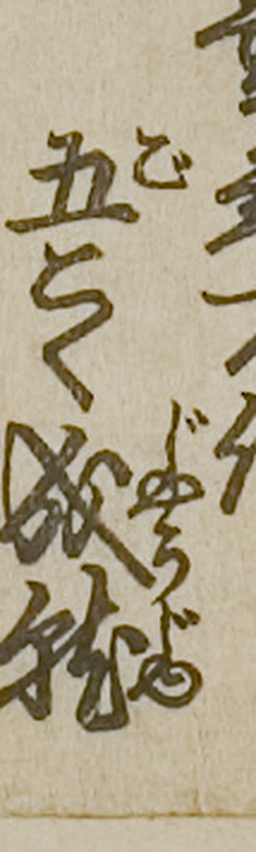五こく成就
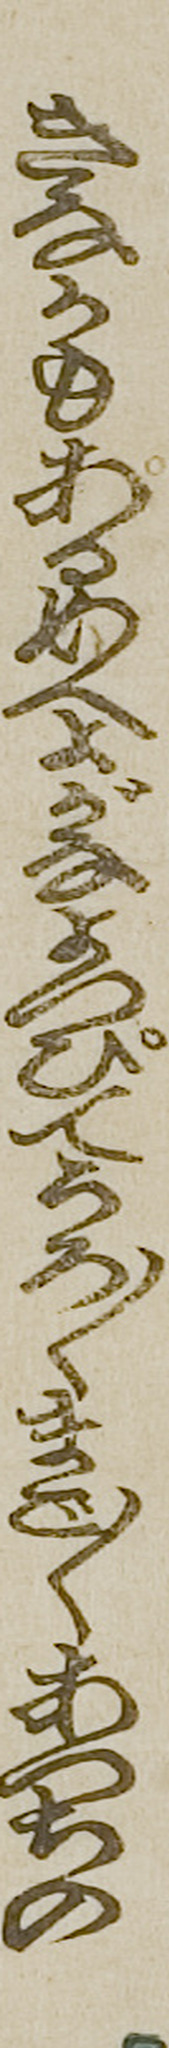きなかもあるめへよがなよつぴてうろ〳〵まご〳〵あつちの
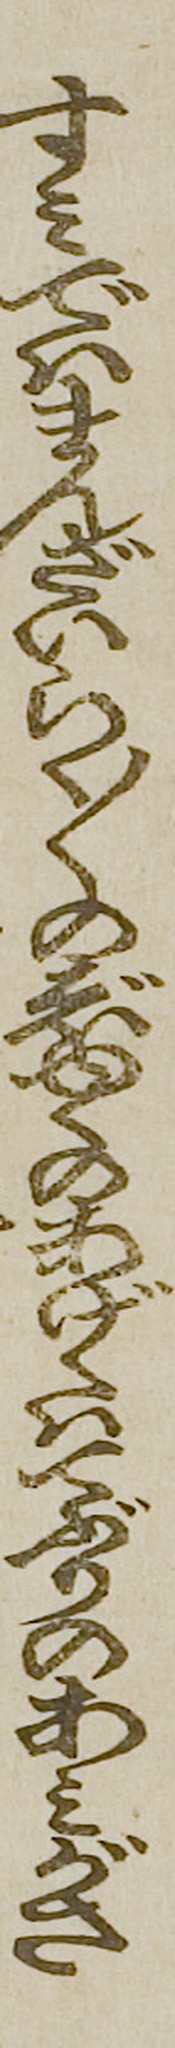すみではまんざいらく〳〵のじゆくのあげたはてぶりのあみがさ
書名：ちょぼくれちょんがれ
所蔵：東京大学総合図書館 General Library in the University of Tokyo, JAPAN
